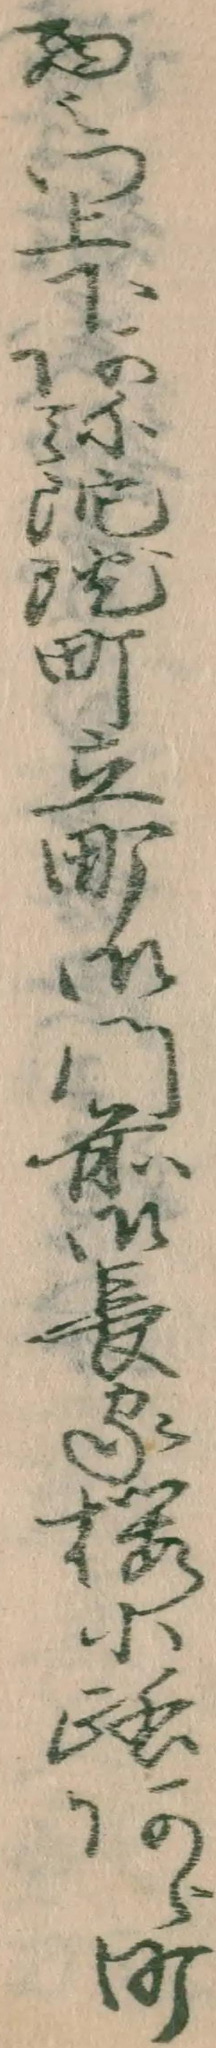西之門上下阿弥陀町立町御門前御長家桜小路あら町
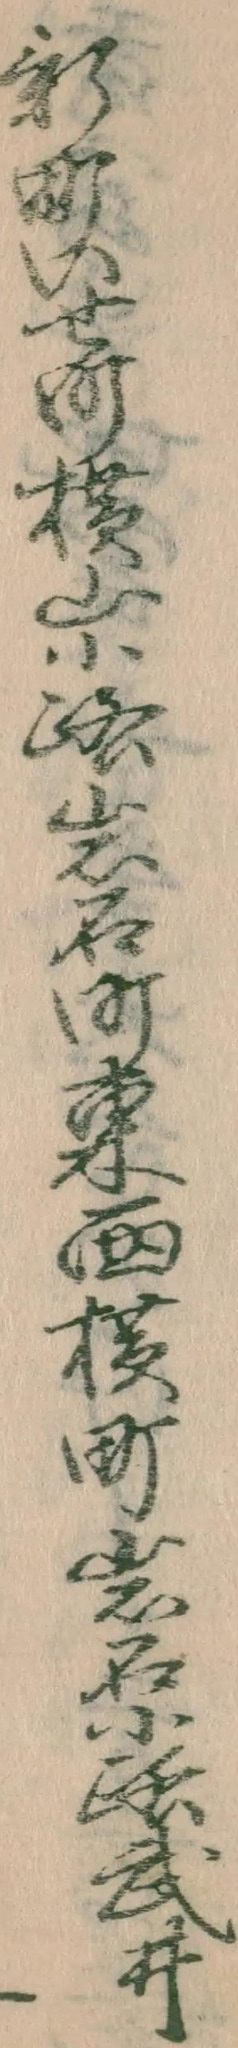新町いせ町横山小路岩石町東西横丁岩石小路武井
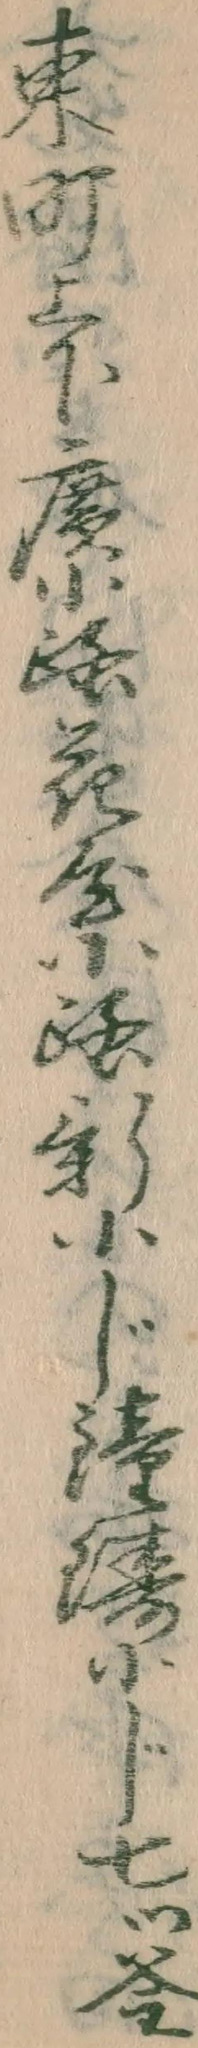東町上下広小路花屋小路新小じ鐘鋳小じ七ツ釜
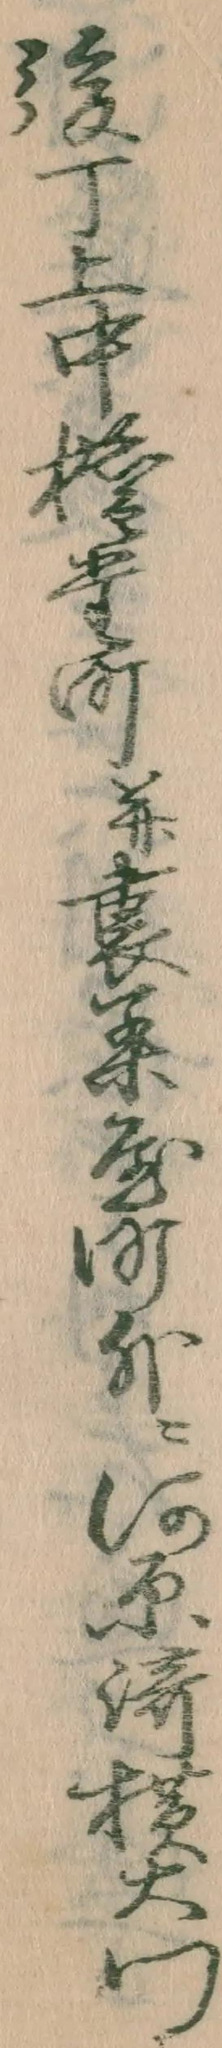後丁上中権堂町并裏茶屋町外ニ河原崎横大門
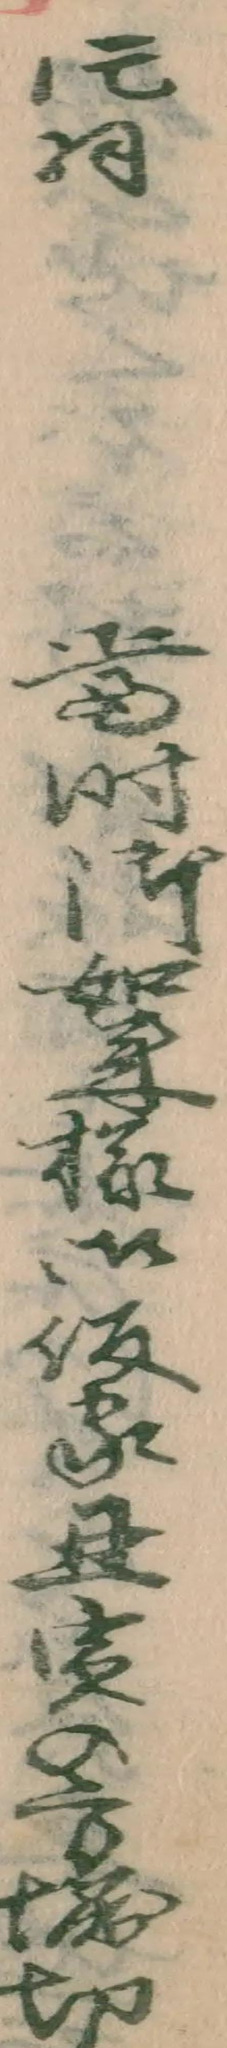片羽当時御如来様御仮家丑寅の方堀切
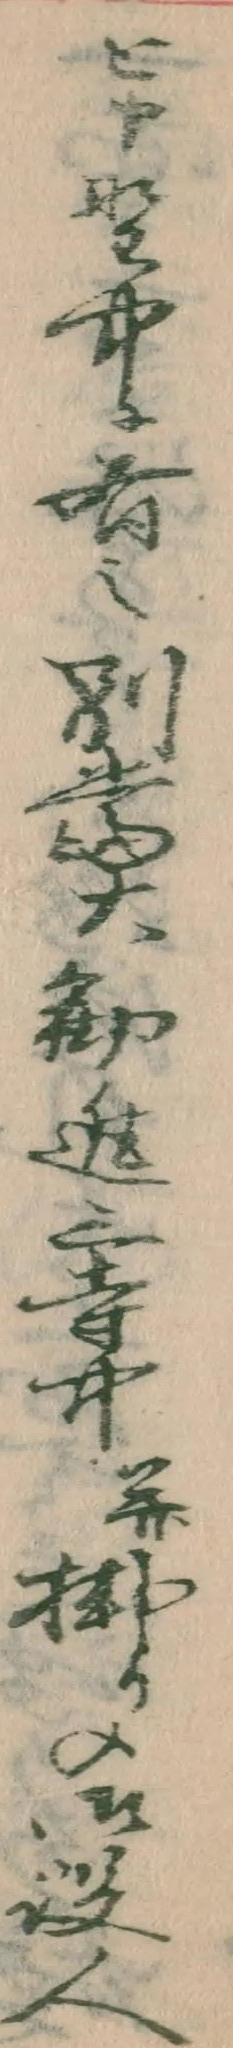と申野中に有之別当大勧進三寺中并掛りの御役人
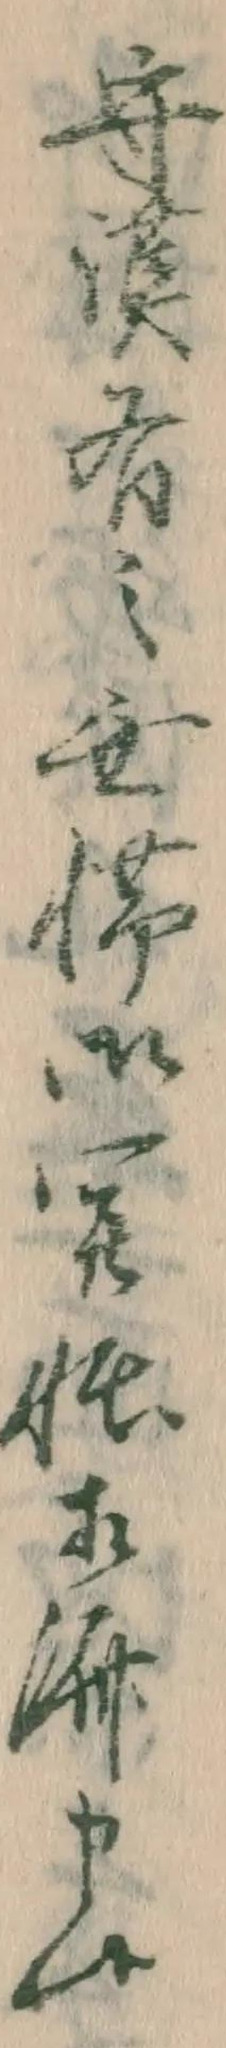守護有之無滞御開帳相済申候
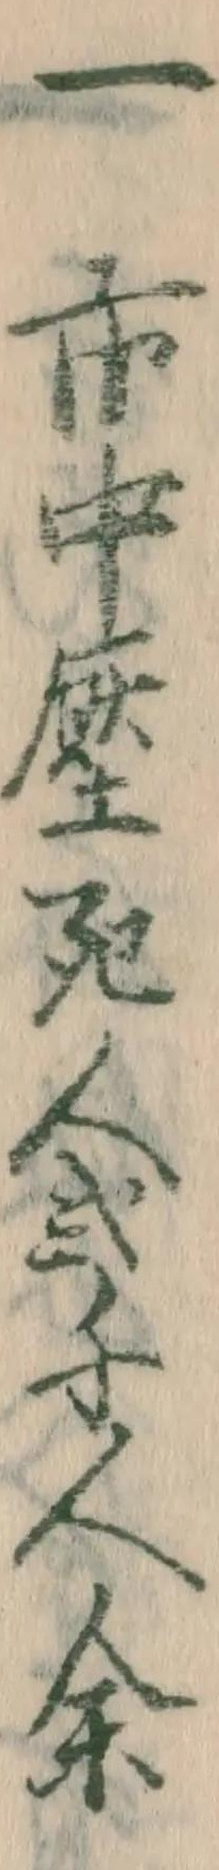一市中圧死人弐千人余
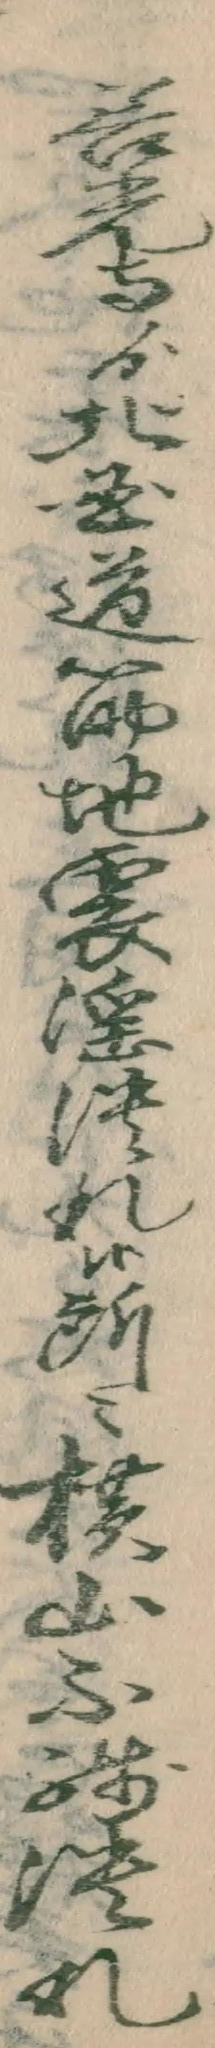一善光寺ゟ北国道筋地震揺潰れ候所〻横山不残潰れ
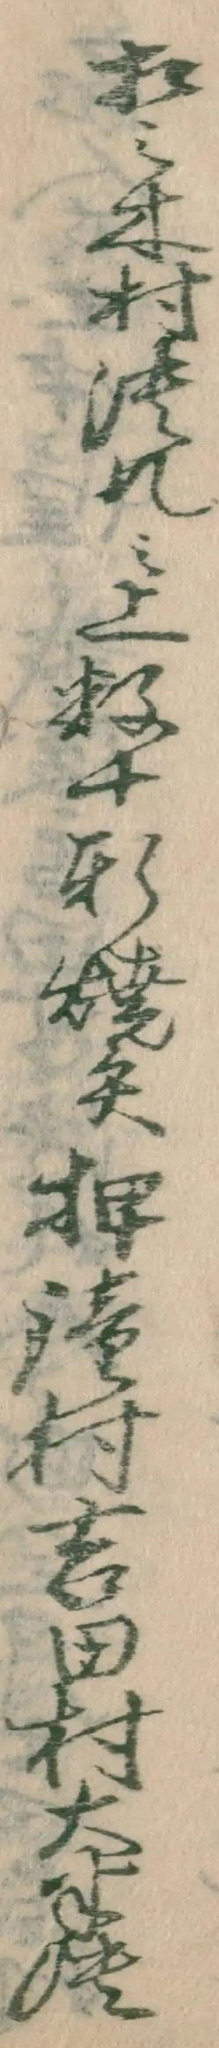相之木村潰れ之上数十軒焼失押鐘村吉田村大半潰
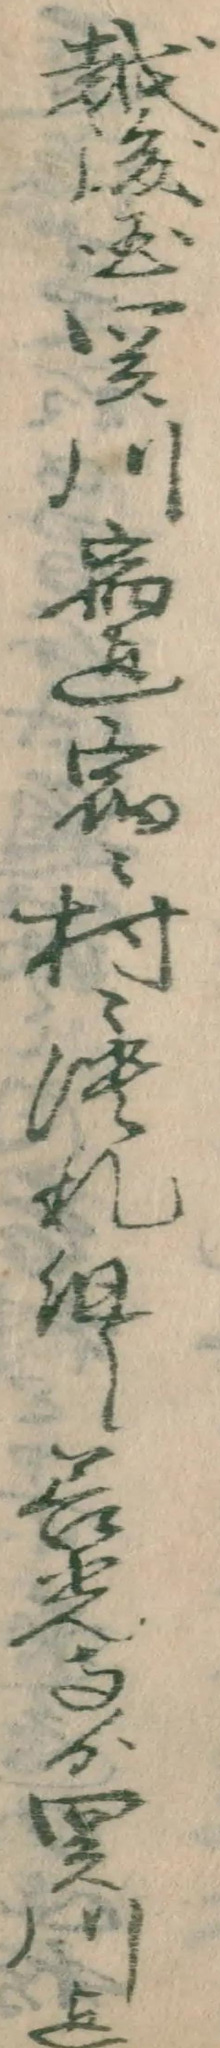越後国関川宿迄宿〻潰れ但し善光寺ゟ関川迄

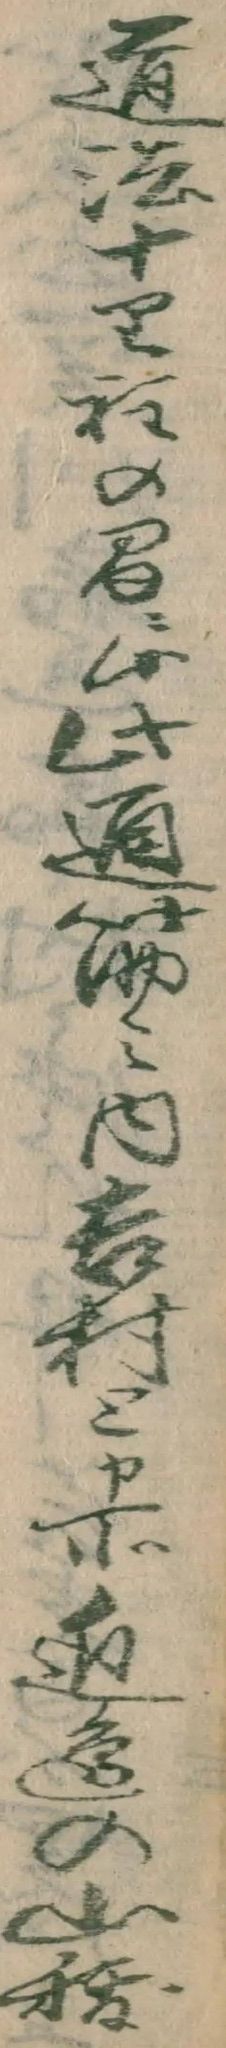道法十里程の間ニ候此通筋之内吉村と申所近辺の山抜
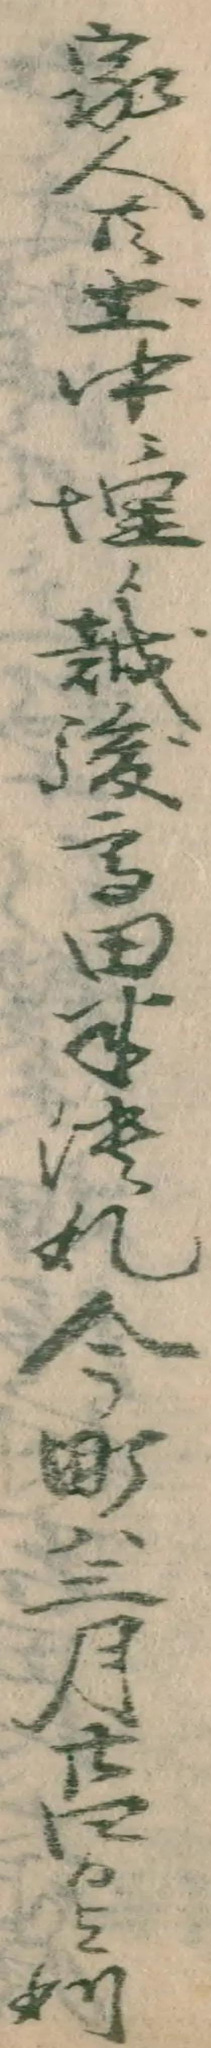家人共土中ニ埋候越後高田半潰れ今町は三月廿四日より
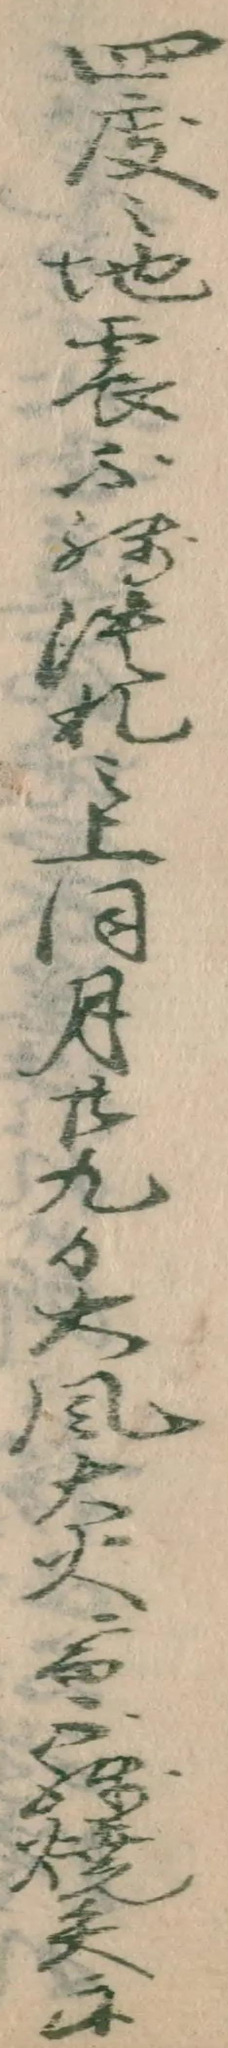四度之地震不残潰れ之上同月廿九日大風大火ニ而不残焼失ニ候
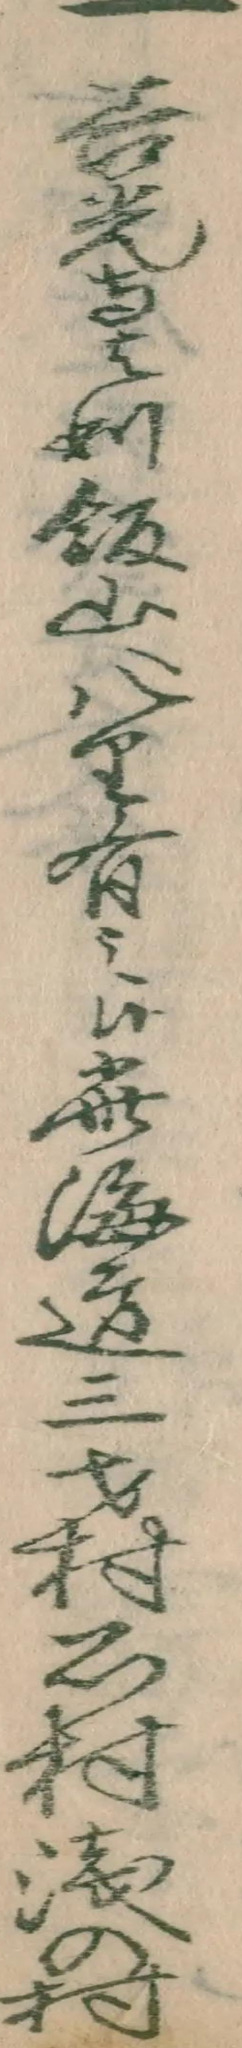一善光寺より飯山へ八里有之候此海道三才村石村浅の村
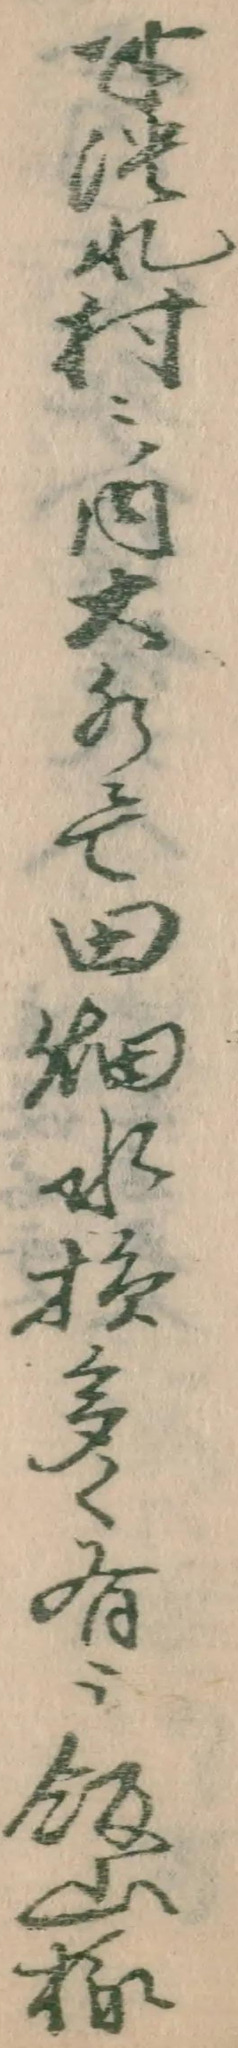半潰れ村〻ノ内大水ニて田畑水損多く有之飯山様
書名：大地震
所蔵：国立国会図書館 National Diet Library, JAPAN
